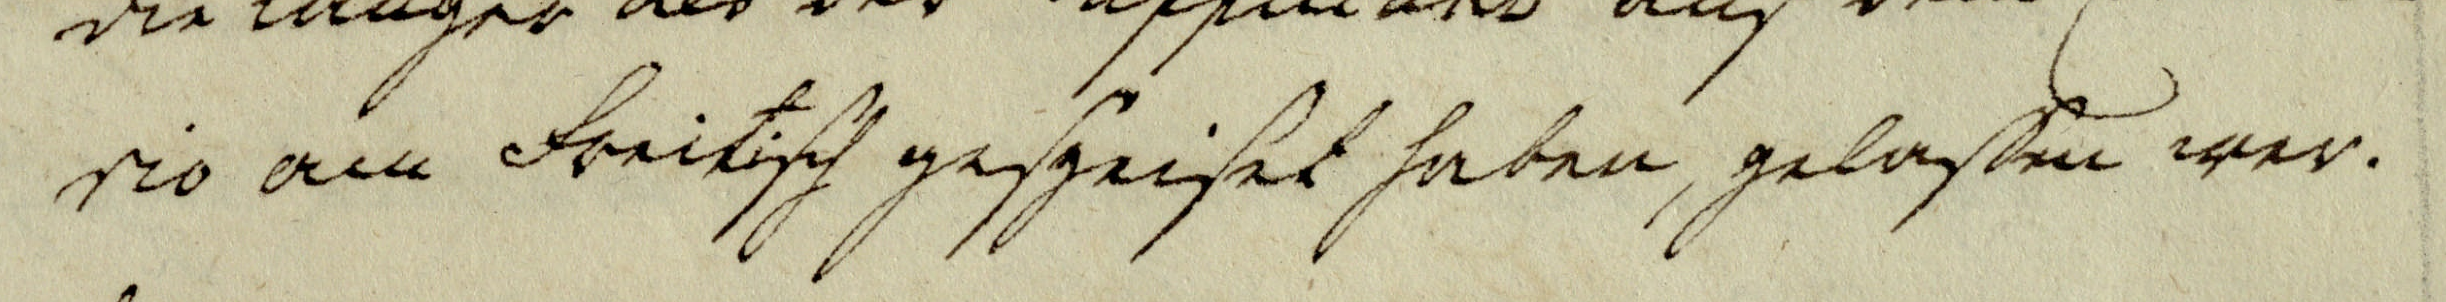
rio am Freitisch gespeiset haben, gelassen wer¬
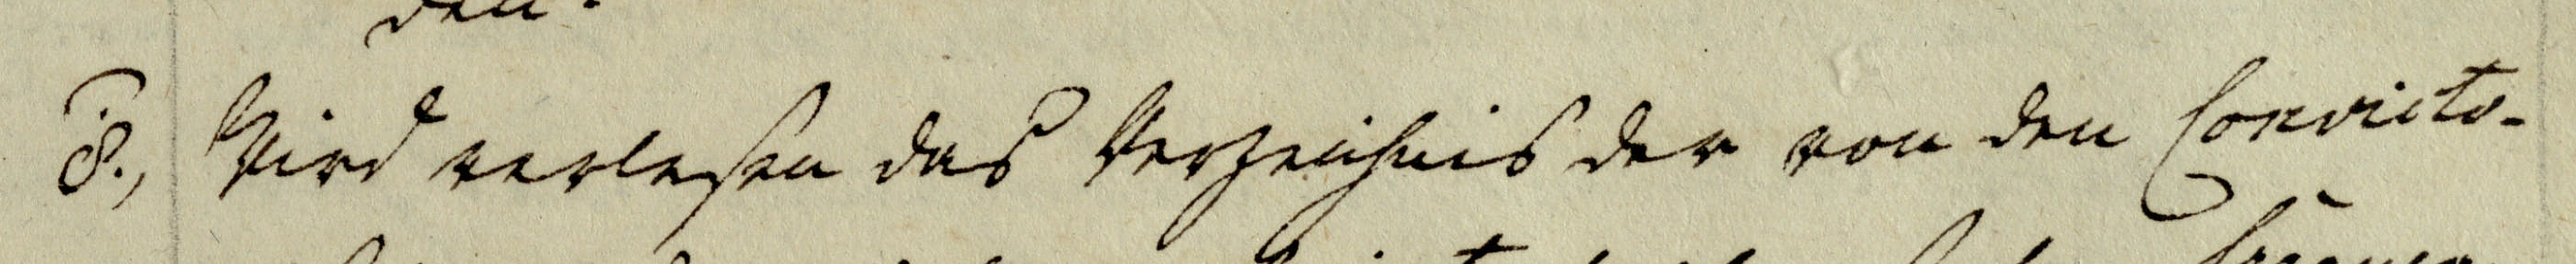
8. Wird verlesen das Verzeichnis der von den Convicto¬
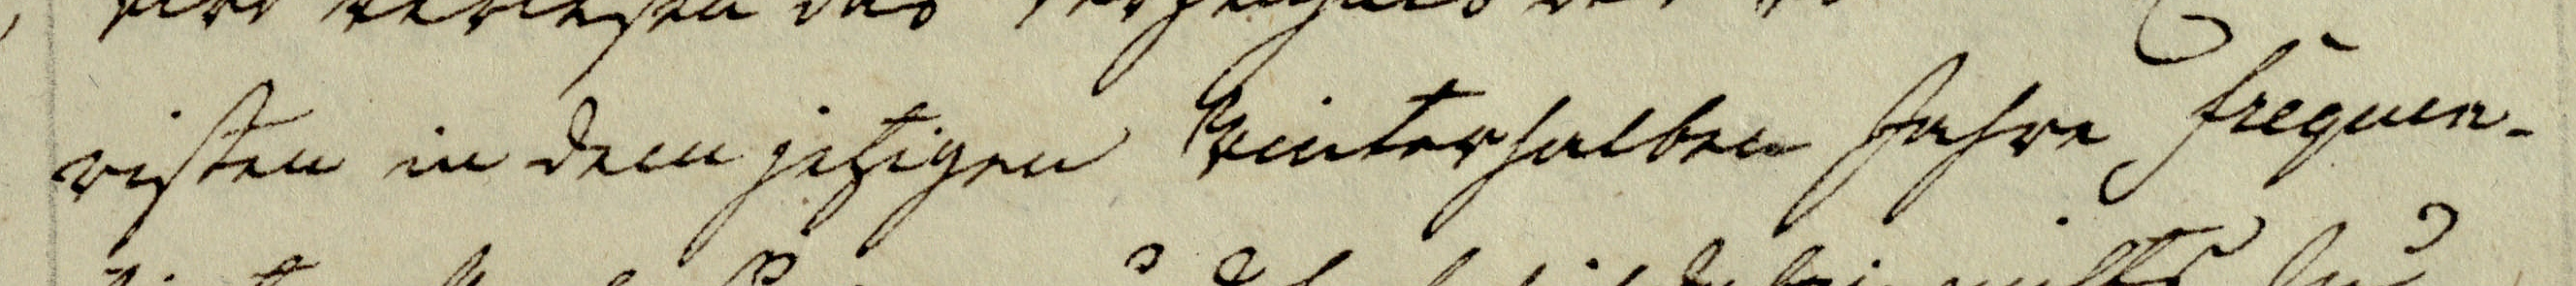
risten in dem jetzigen Winterhalben Jahre frequen¬
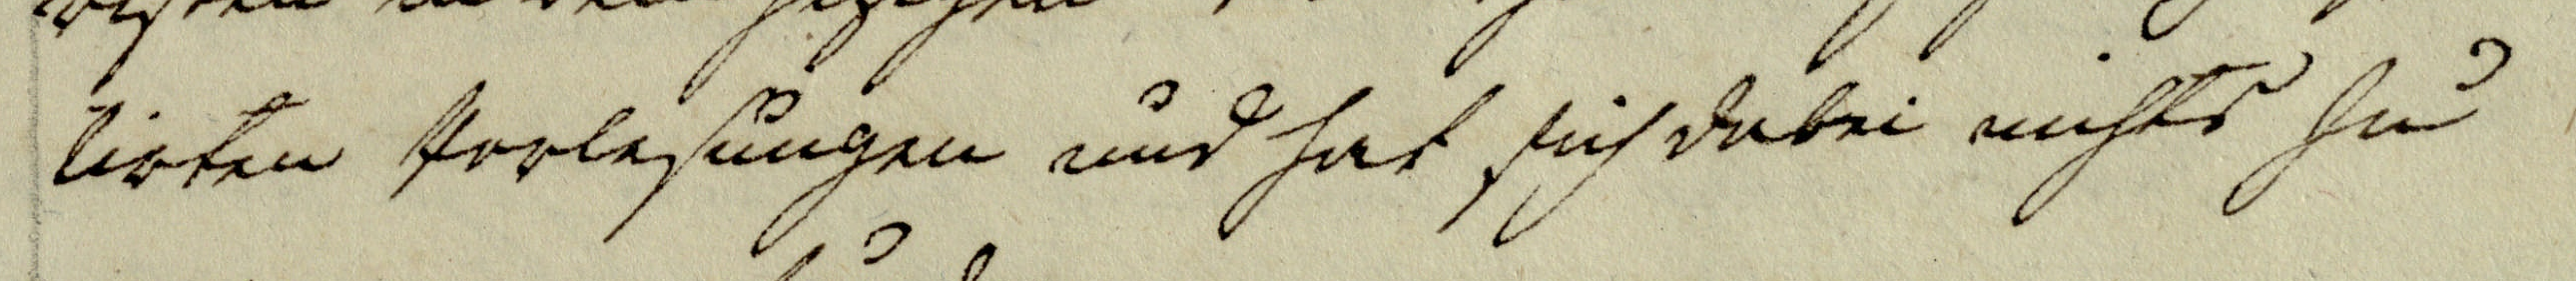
tirten Vorlesungen und hat sich dabei nichts zu
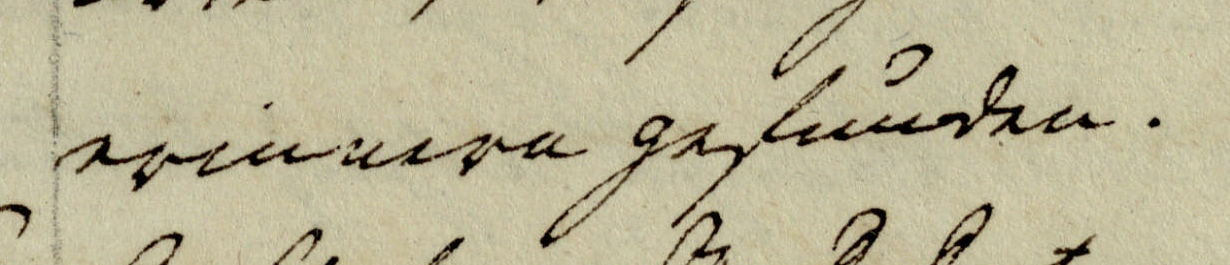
erinnern gefunden.
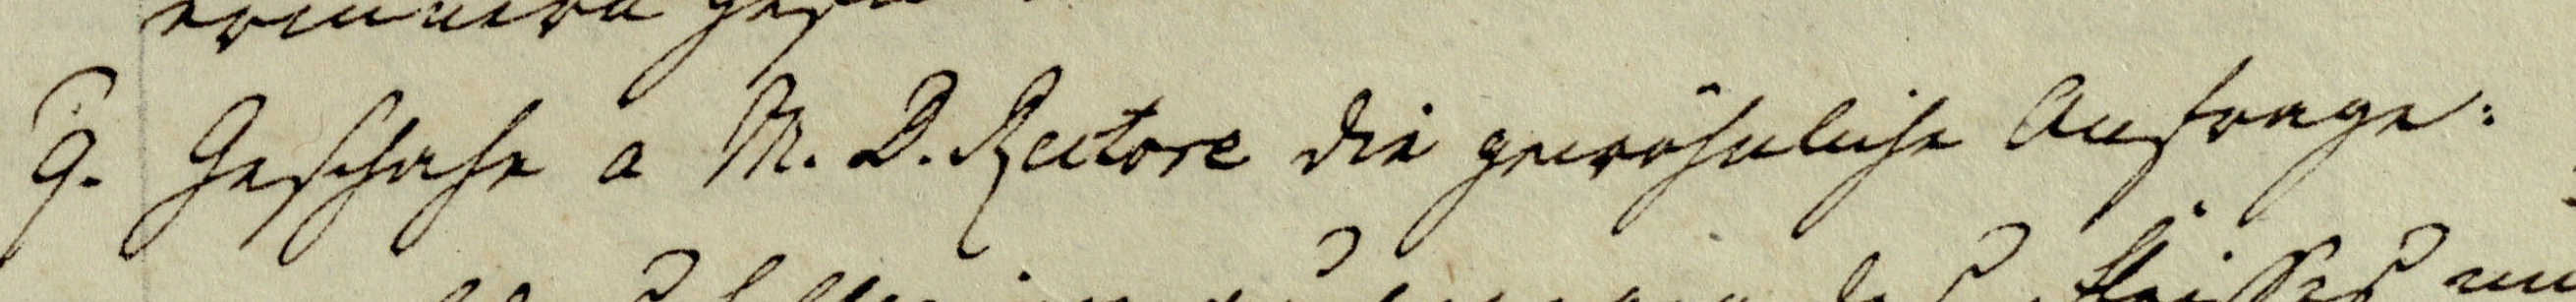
9. Geschahe a M. D. Rectore die gewöhnliche Anfrage:
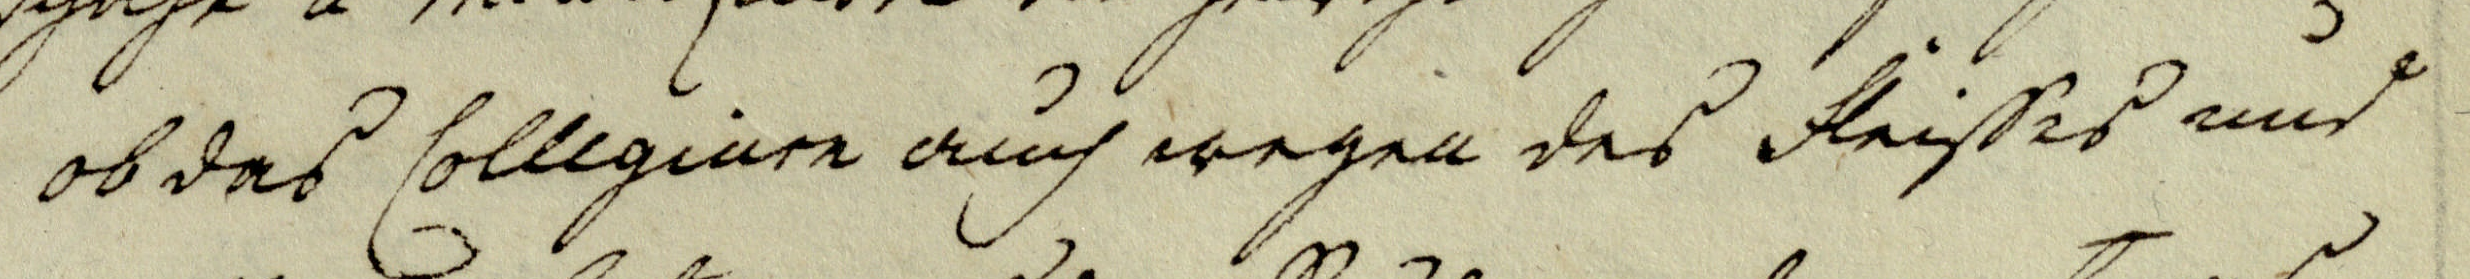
ob des Collegium auch wegen des Fleisses und
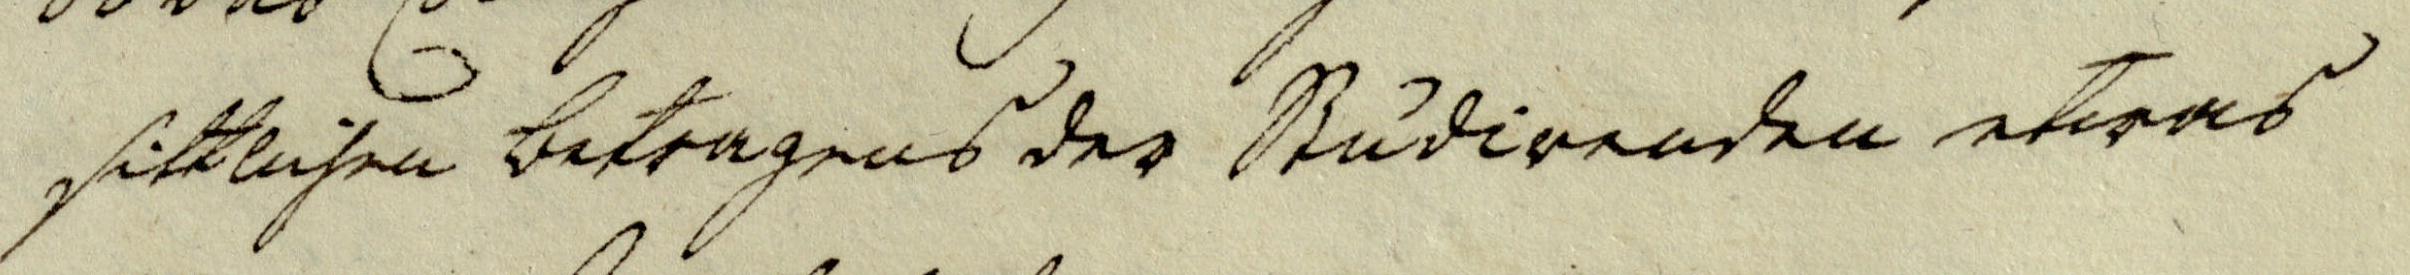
sittlichen Betragens der Studirenden etwas
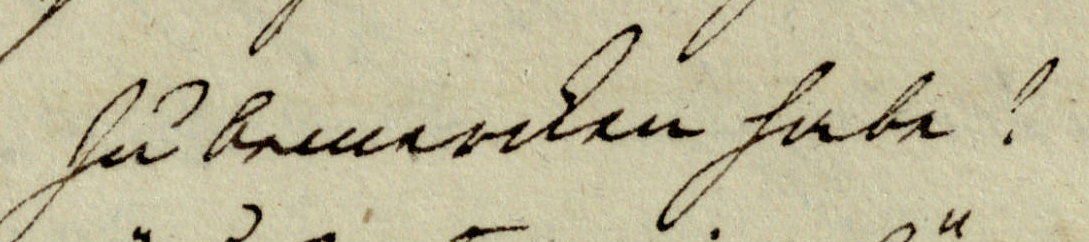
zu bemercken habe?
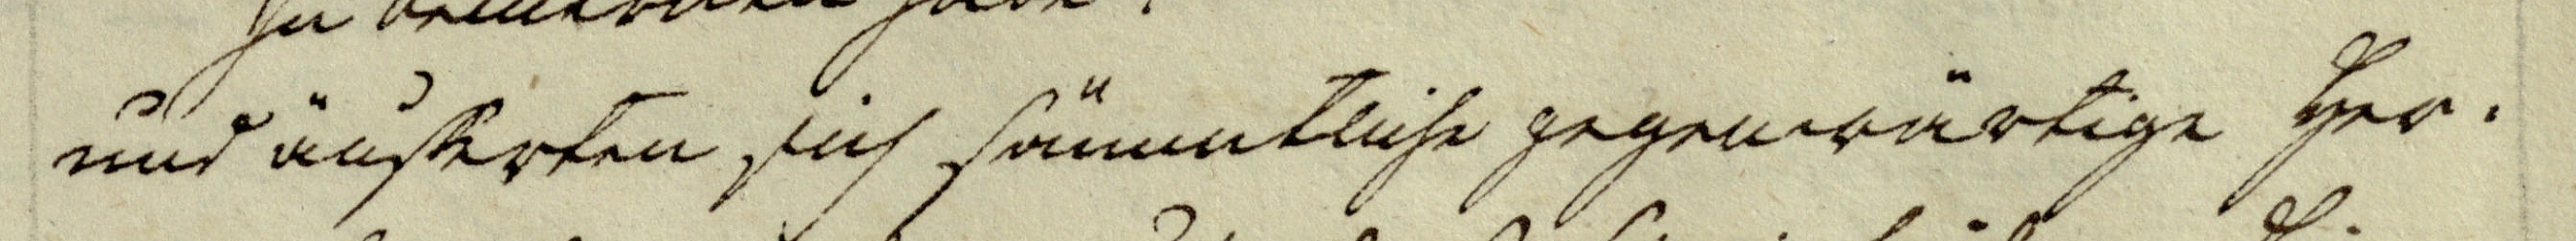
und äusserten sich sämmtliche gegenwärtige Her¬
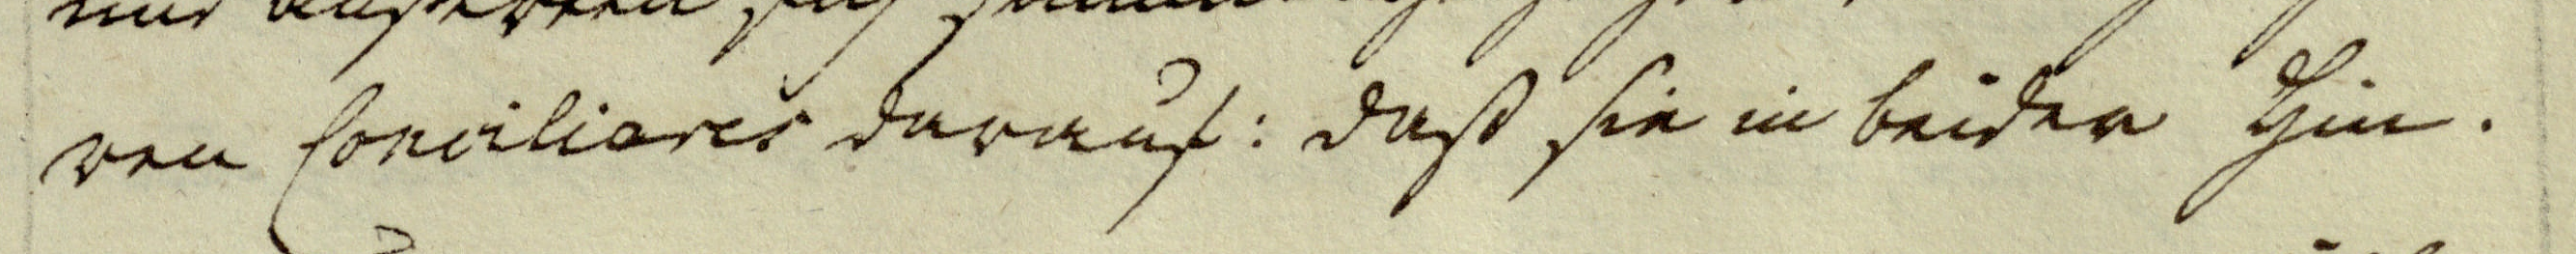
den Conciliares darauf: daß sie in beider Hin¬
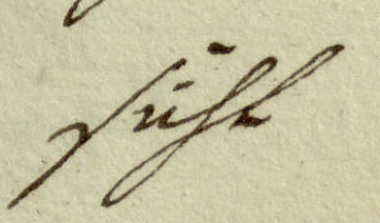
sicht
